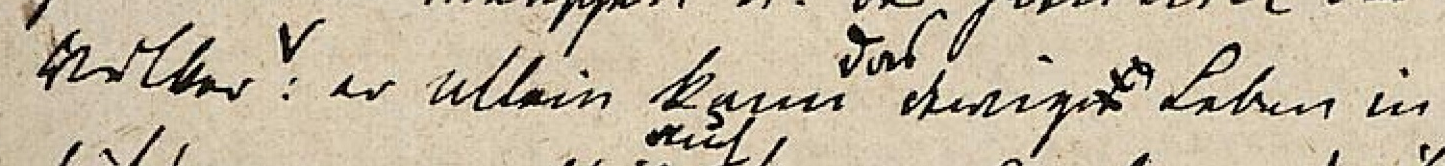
Völker: er allein kann ewiges Leben in
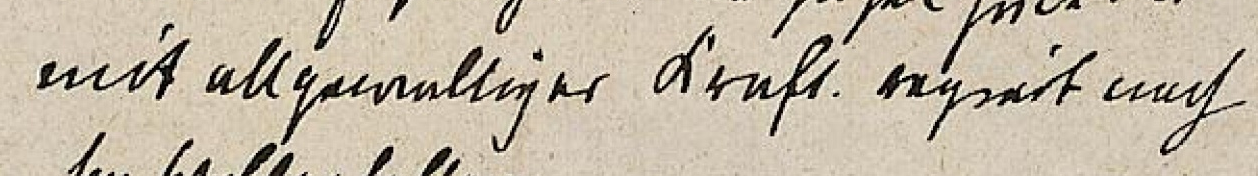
mit allgewaltiger Kraft. regiert nach
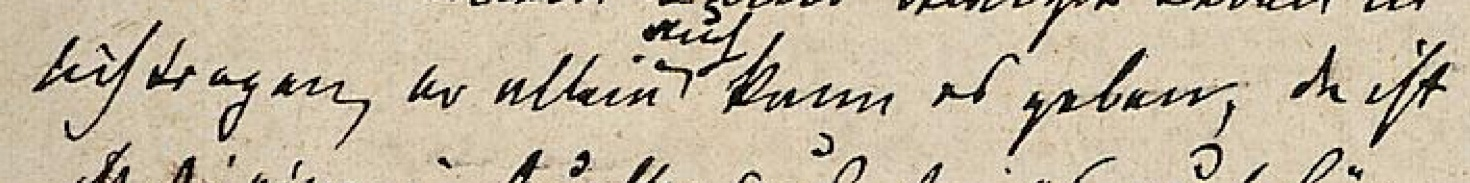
sich tragen, er allein kann es geben, da ist
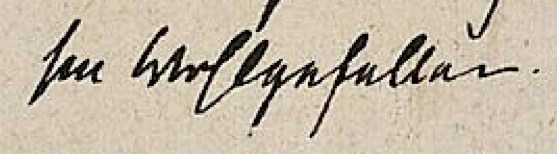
sm Wohlgefallen
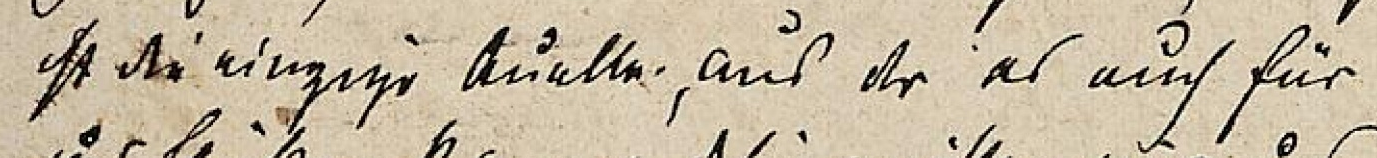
ist die einzige Quelle, aus dr es auch für
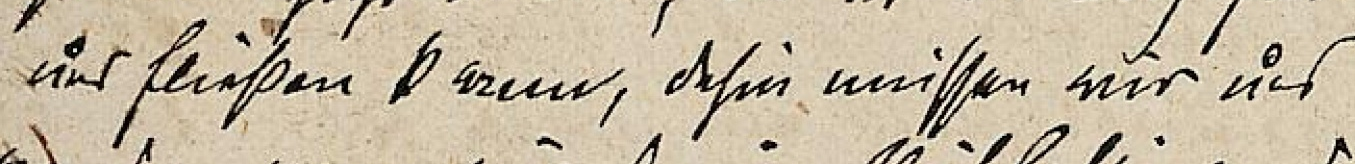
uns fließen kann, dahin müssen wir uns
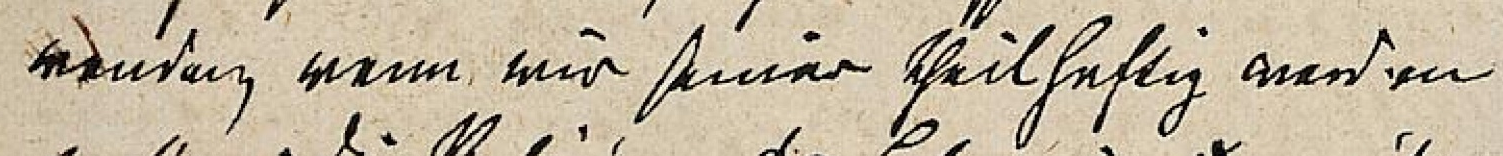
wenden, wenn wir seiner theilhaftig werden
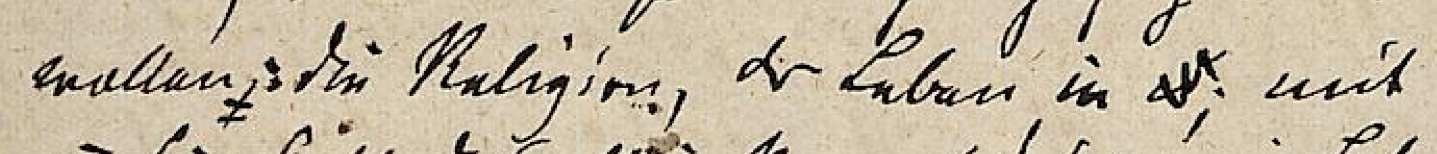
wollen: die Religion, ds Leben in od. mit
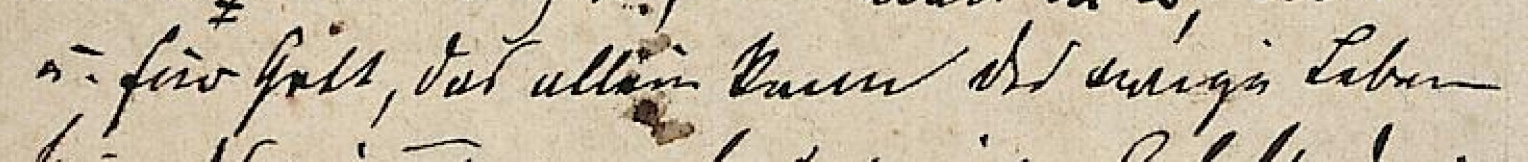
u. für Gott, das allein kann das ewige Leben
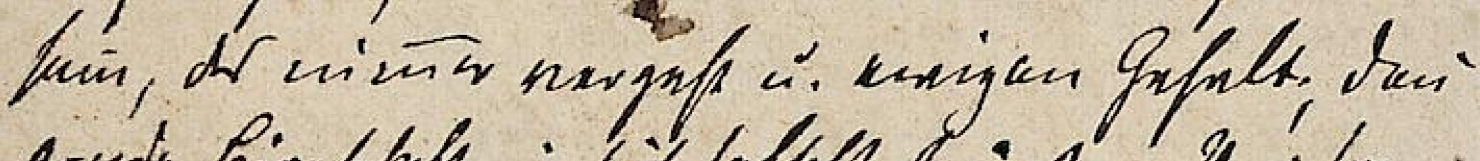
sein, des nimer vergeht u. ewigen Gehalt; dau¬
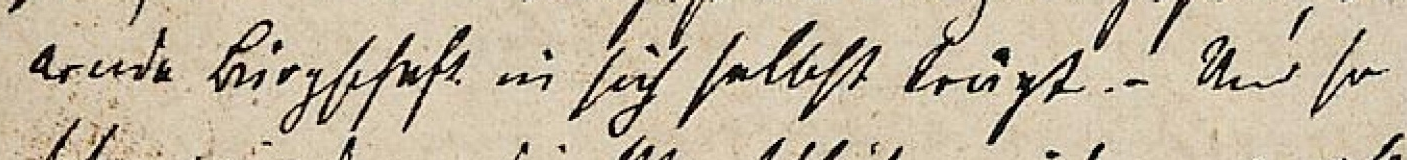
ernde Büngschaft in sich selbst trägt. Und so
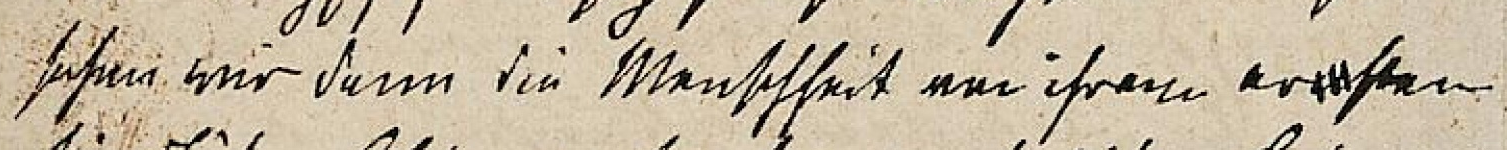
sehen wir denn die Menschheit vor ihrem ernsten
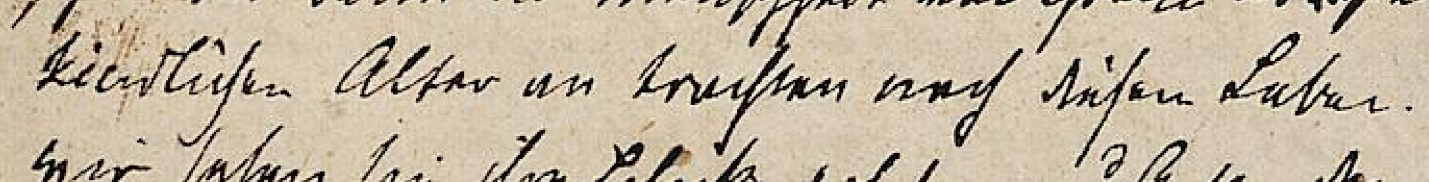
kindlichen Alter an trachten nach diesem Leben
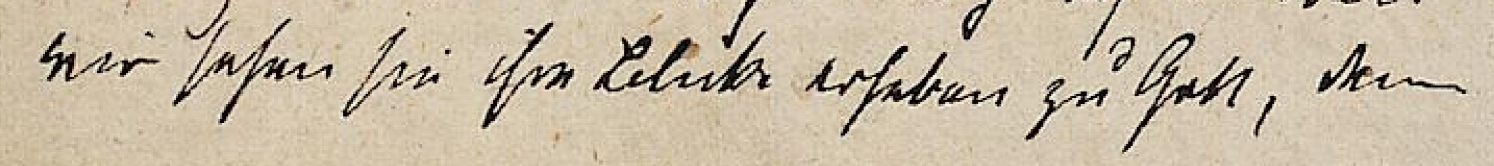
wir sehen sie ihre Blicke erheben zu Gott, dem
